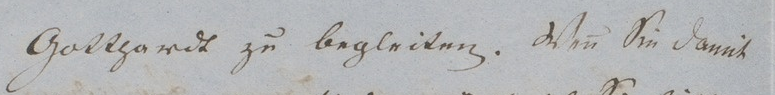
Gotthardt zu begleiten. Wenn Sie damit
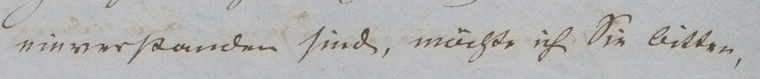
einverstanden sind, möchte ich Sie bitten,
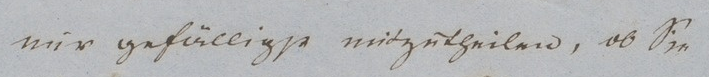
mir gefälligst mitzutheilen, ob Sie
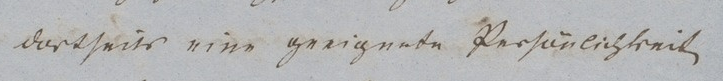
dortseits eine geeignete Persönlichkeit
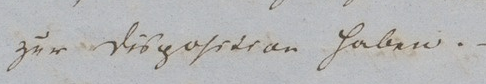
zur Disposition haben. –
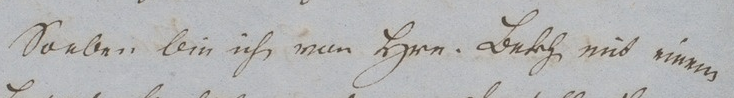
Soeben bin ich von Hrn. Bekh mit einem
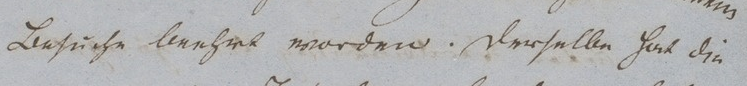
Besuche beehrt worden. Derselbe hat die
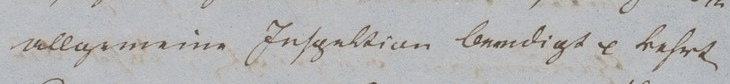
allgemeine Inspektion beendigt & kehrt
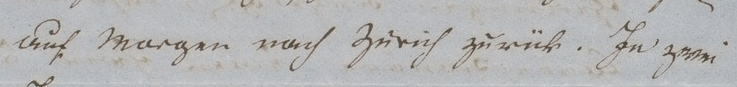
auf Morgen nach Zürich zurük. In zwei
